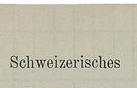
Schweizerisches
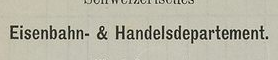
Eisenbahn- & Handelsdepartement.
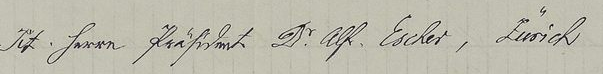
Tit. Herrn Präsident Dr Alfr. Escher, Zürich
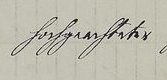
Hochgeachteter
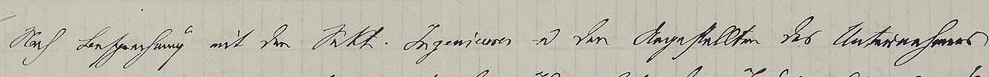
Nach Besprechung mit den Sekt.Ingenieures & den Angestellten des Unternehmens
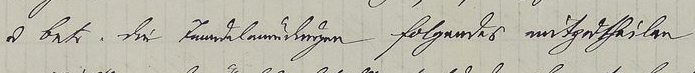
& betr. die Tunnelmündungen folgendes mitzutheilen.
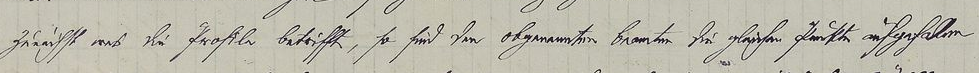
Zunächst was die Profile betrifft, so sind den obgenannten Beamten die gleichen Punkte aufgefallen
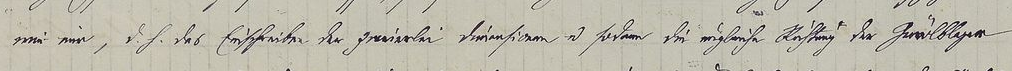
wie mir, d. h. das Einschreiben der zweierlei Dimensionen & sodann die mögliche Richtung der Gewölblager
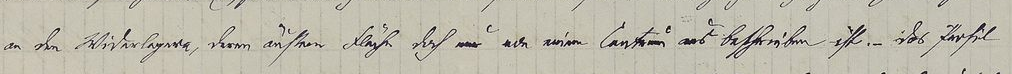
an den Widerlagern, deren äußere Fläche doch nur von einem Centrum aus beschrieben ist. – Das Profil
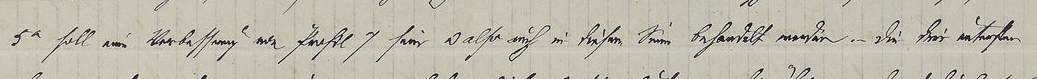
9a soll eine Verbesserung von Profil 7 sein & also auch in diesem Sinne behandelt werden. – Die drei untersten
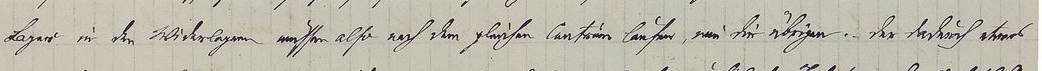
Lager in den Widerlagern müssen also nach dem gleichen Centrum laufen, wie die übrigen. – Der dadurch etwas
